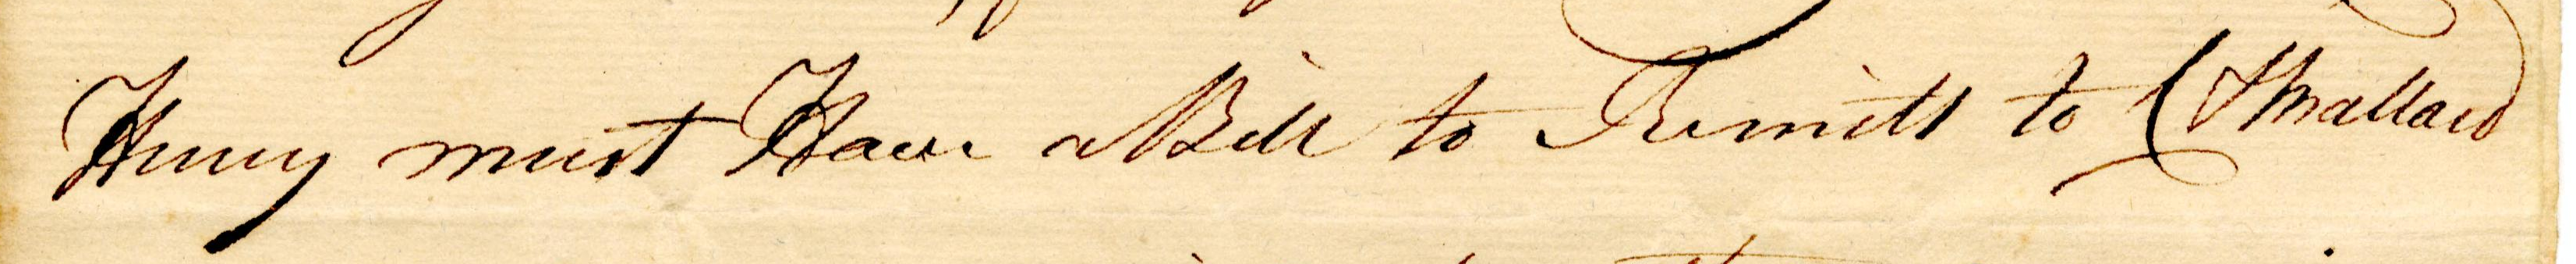Henry must Have a Bill to Remitt to C Smallard
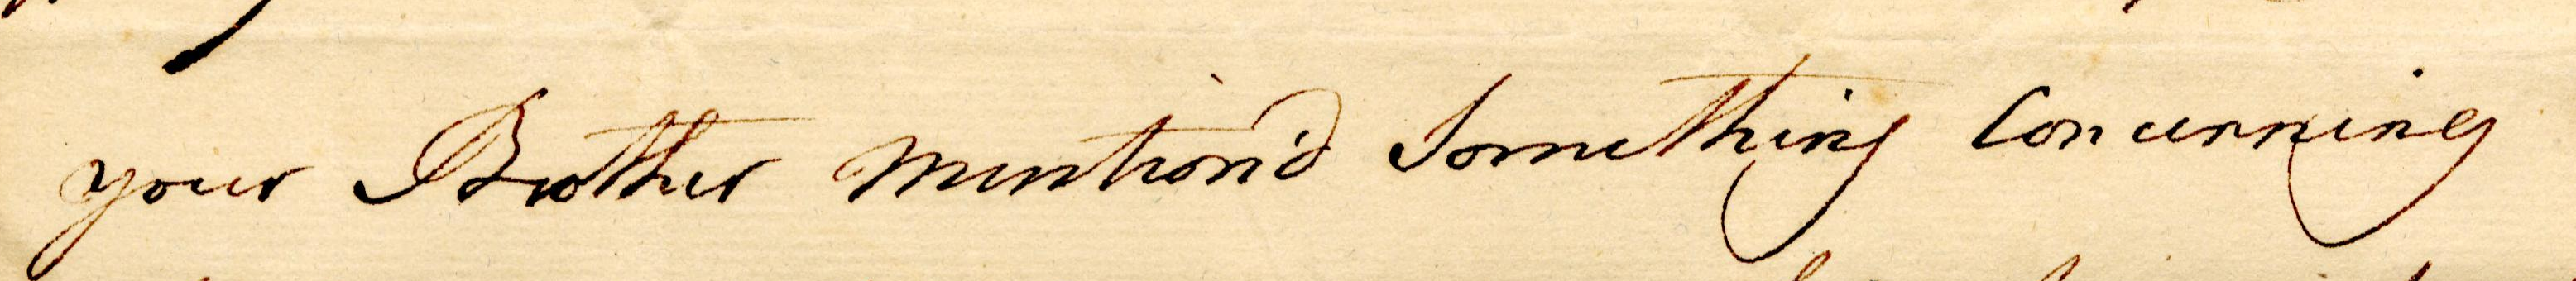your Brother mention'd something Concerning
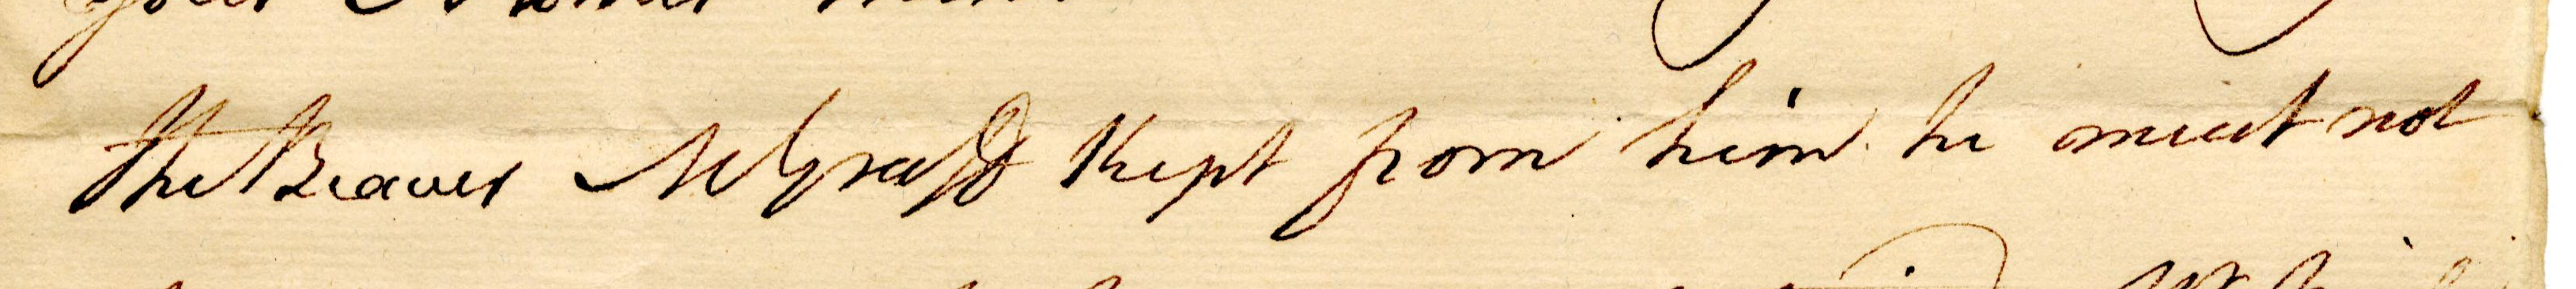the Beaver M^r Gratz kept from him he must not
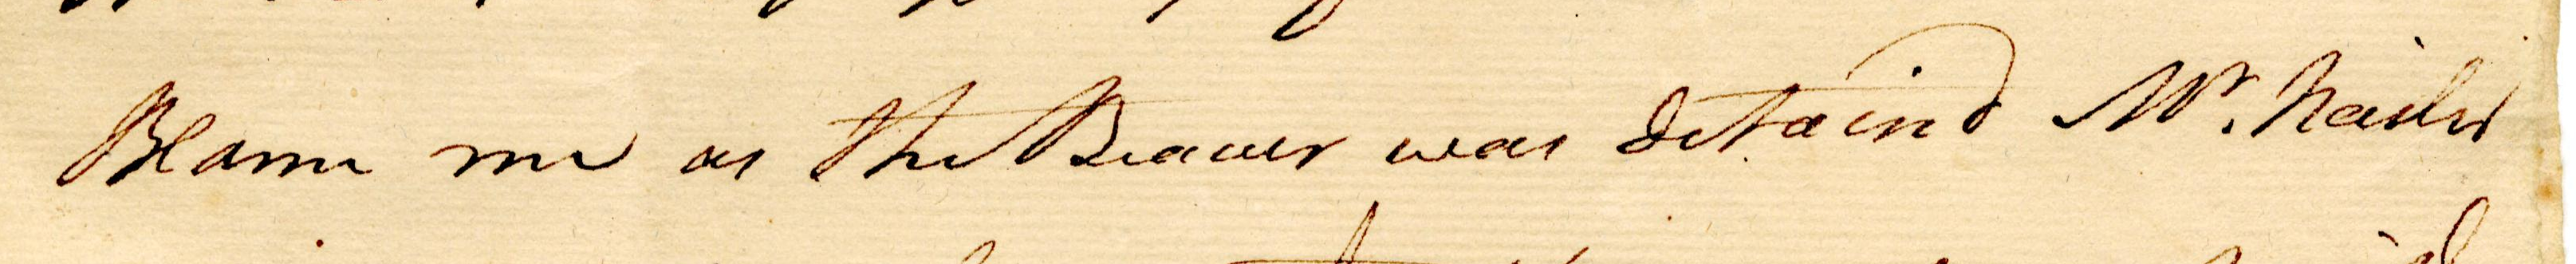Blame me as the Beaver was detaind M^r Naider
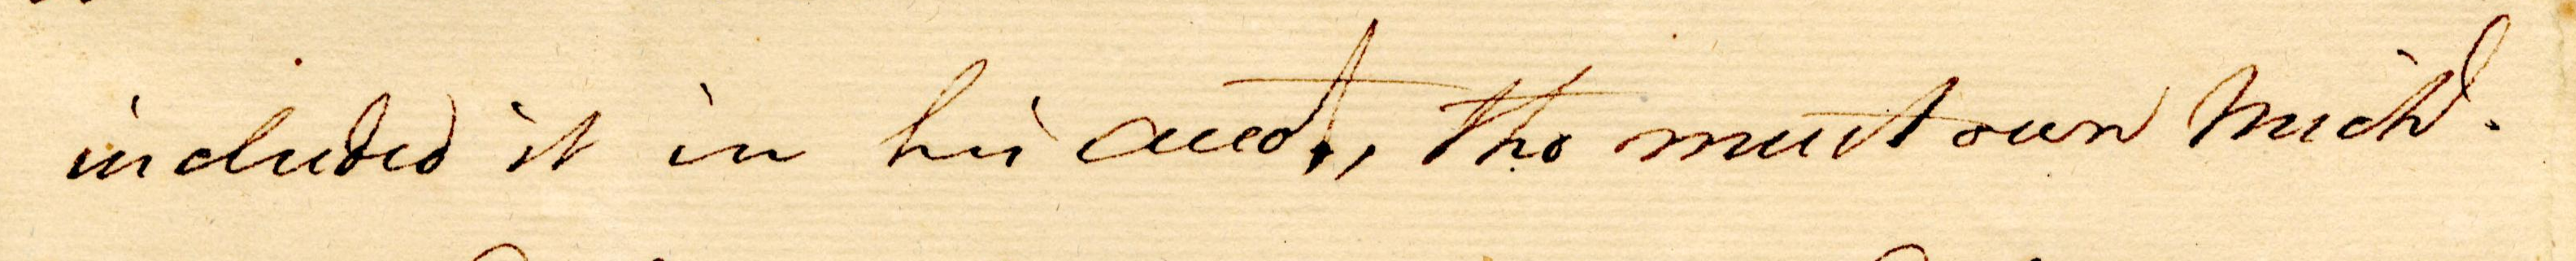included it in his Acco^t, tho must own mich^l
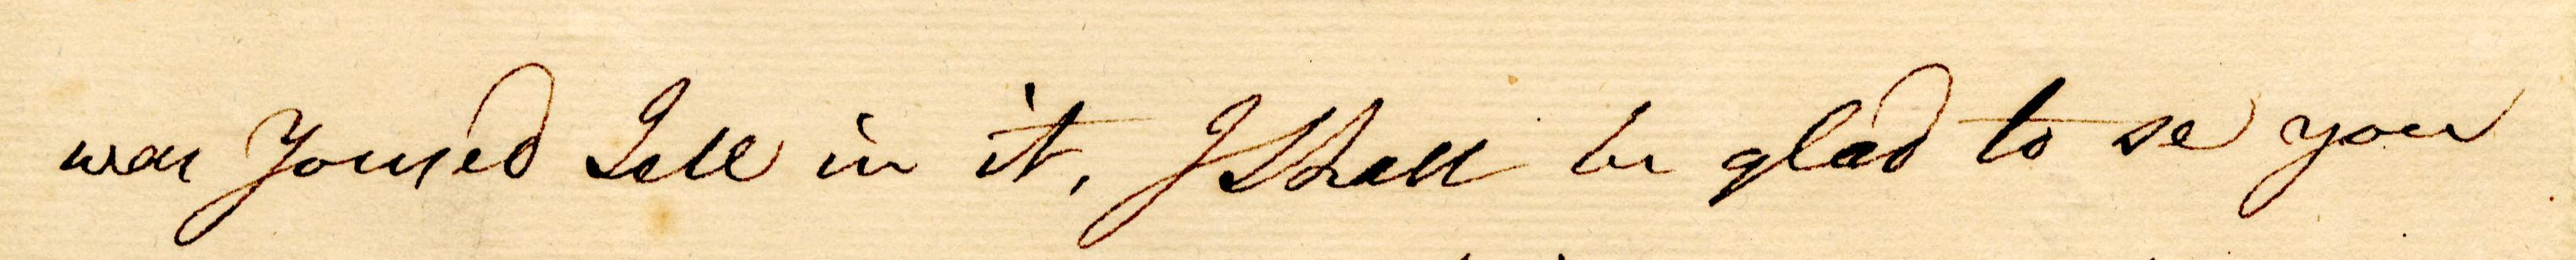was youed sale in it, I shall be glad to se you
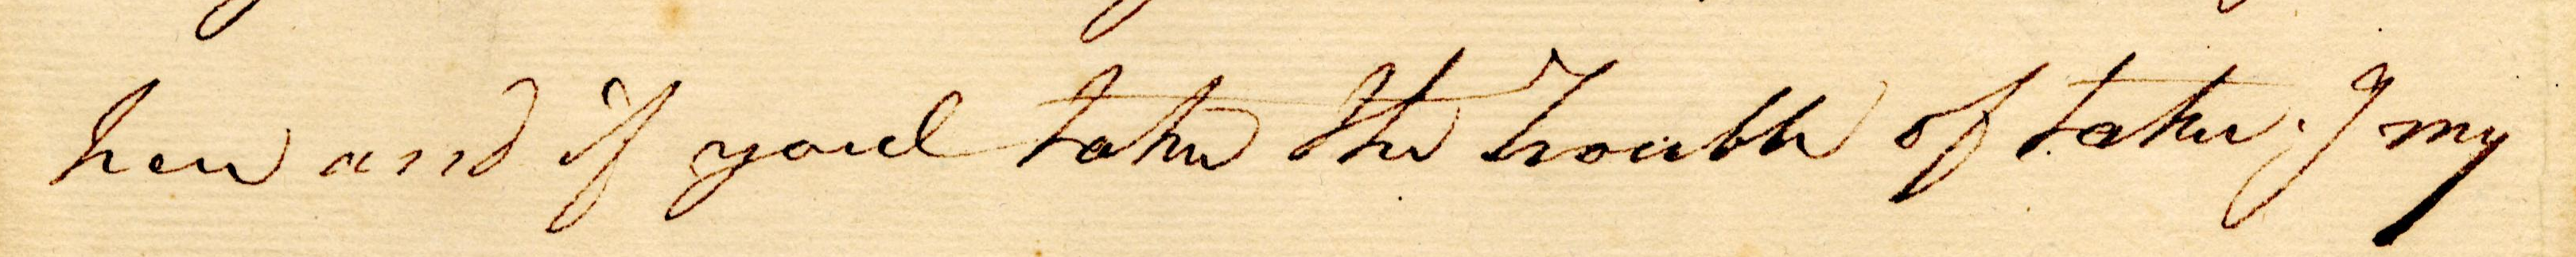here and if youl take the trouble of take^g. my
